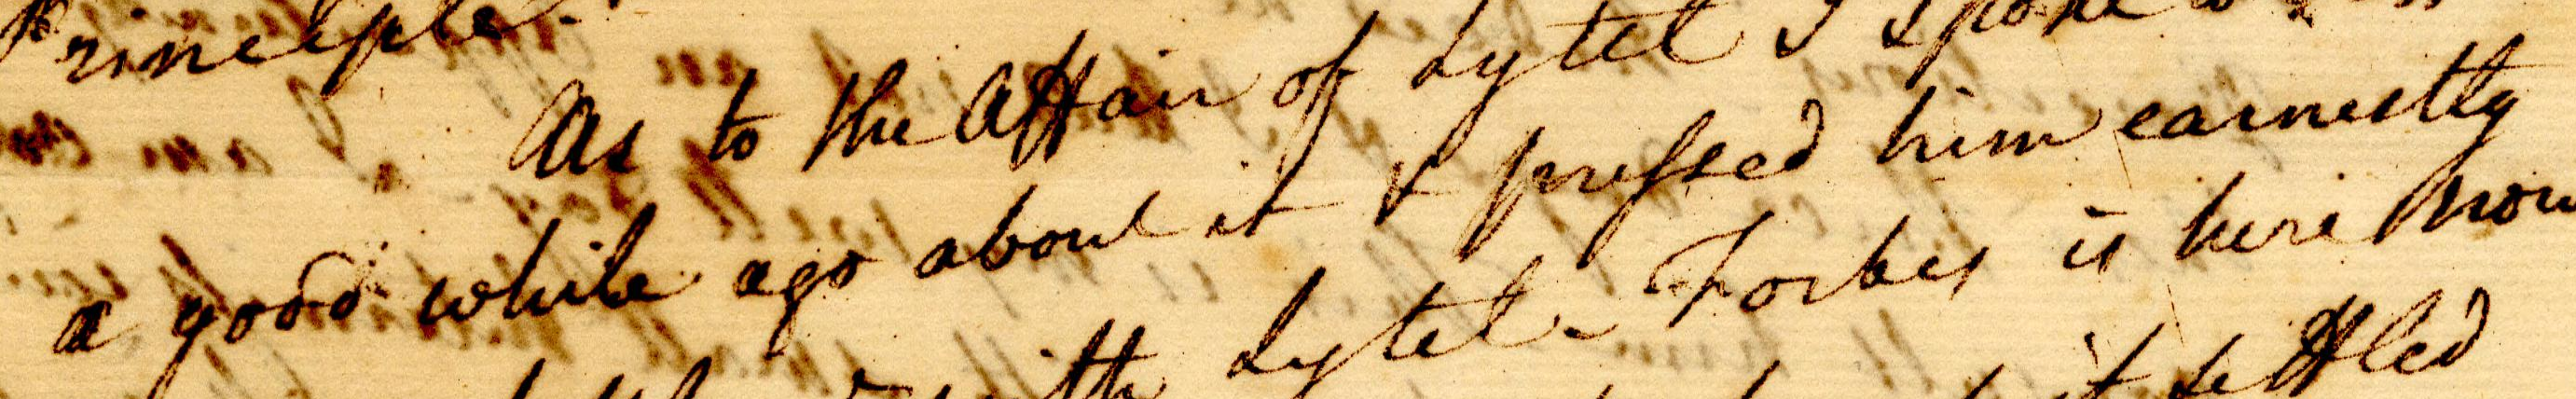a good while ago about it & pressed him earnestly
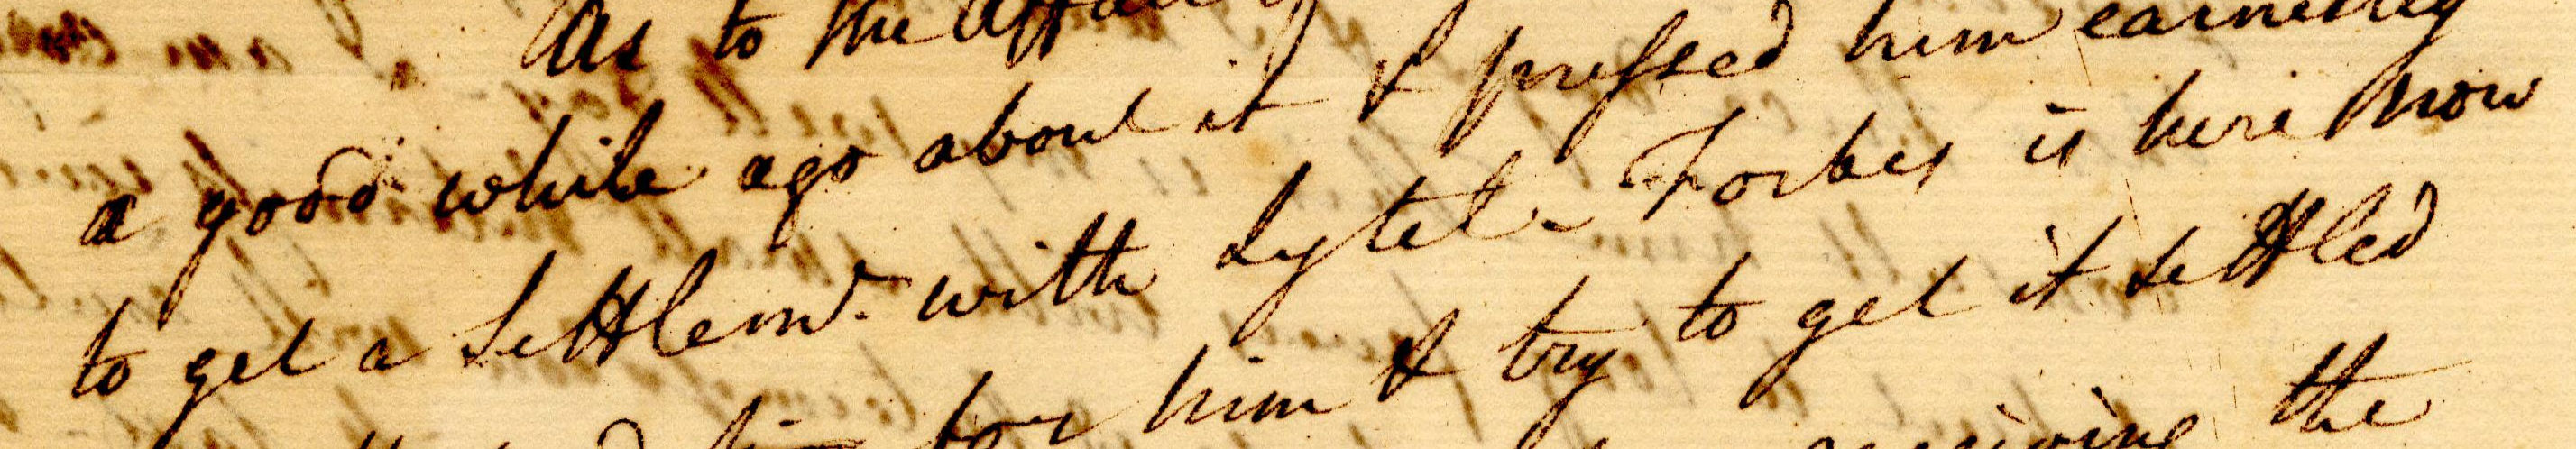to get a Settlem^t. with Lytel. Forbes is here now
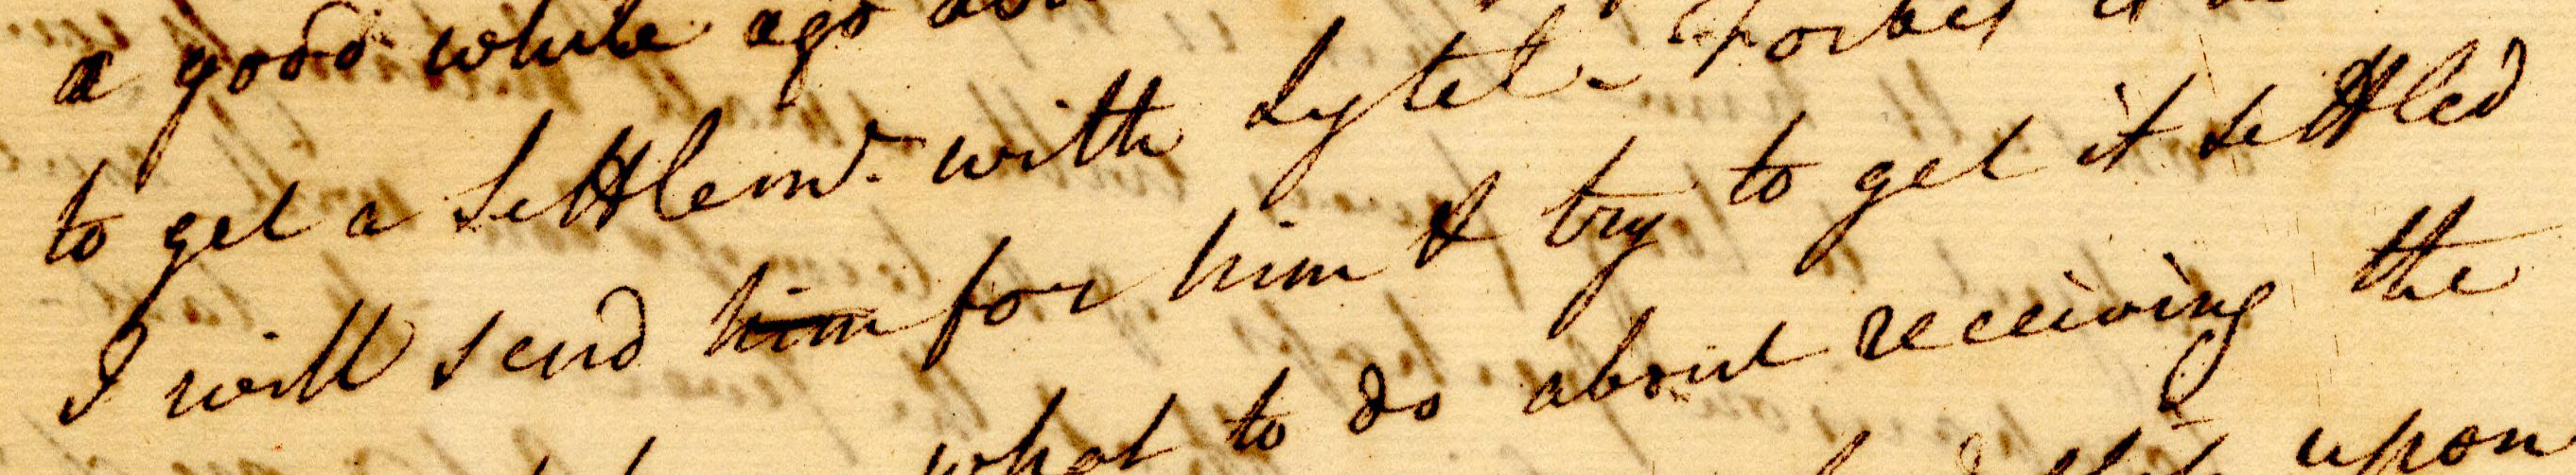I will send him for him & beg to get it settled
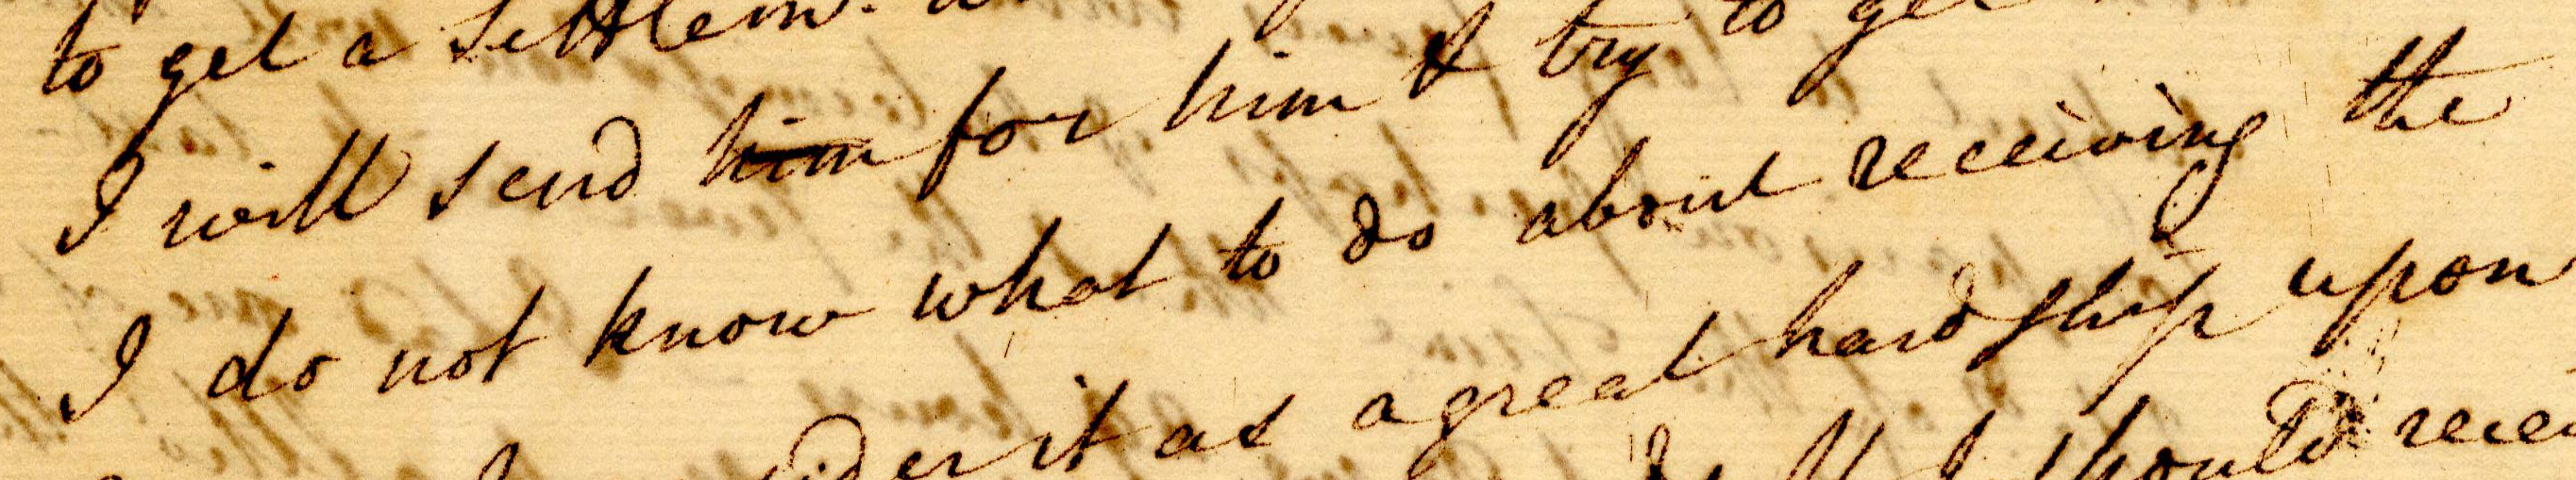I do not know what to do about receiving the
